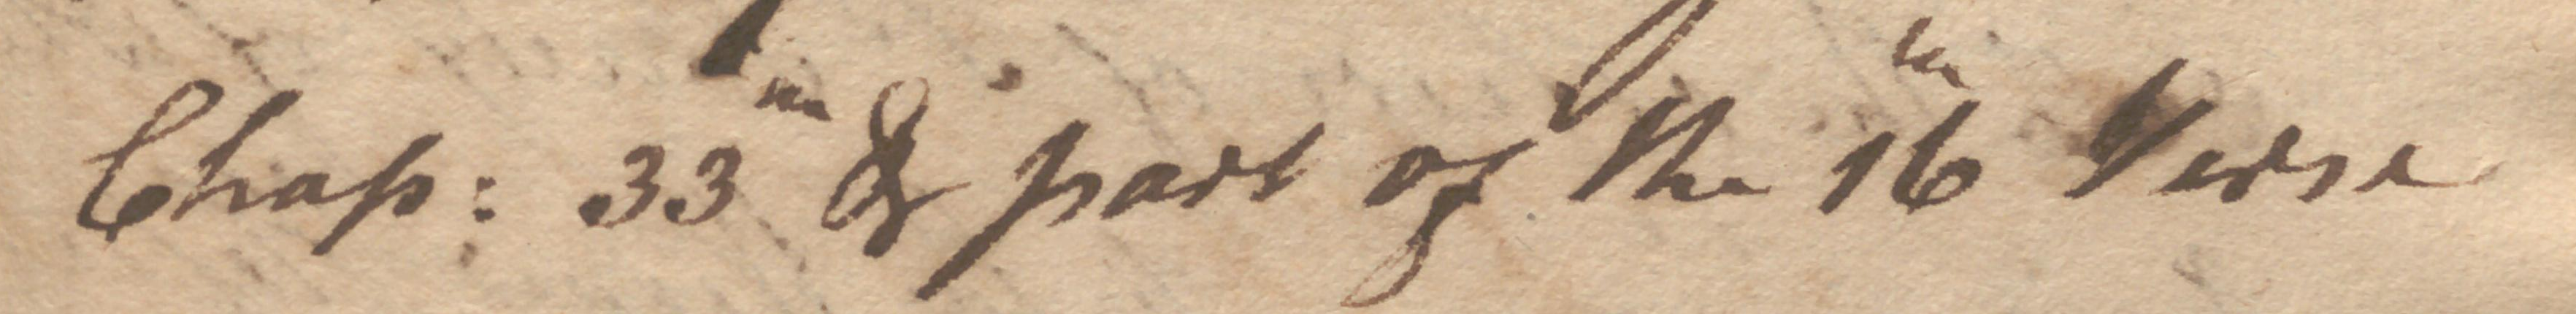Chap: 33^th & part of the 16^th Verse
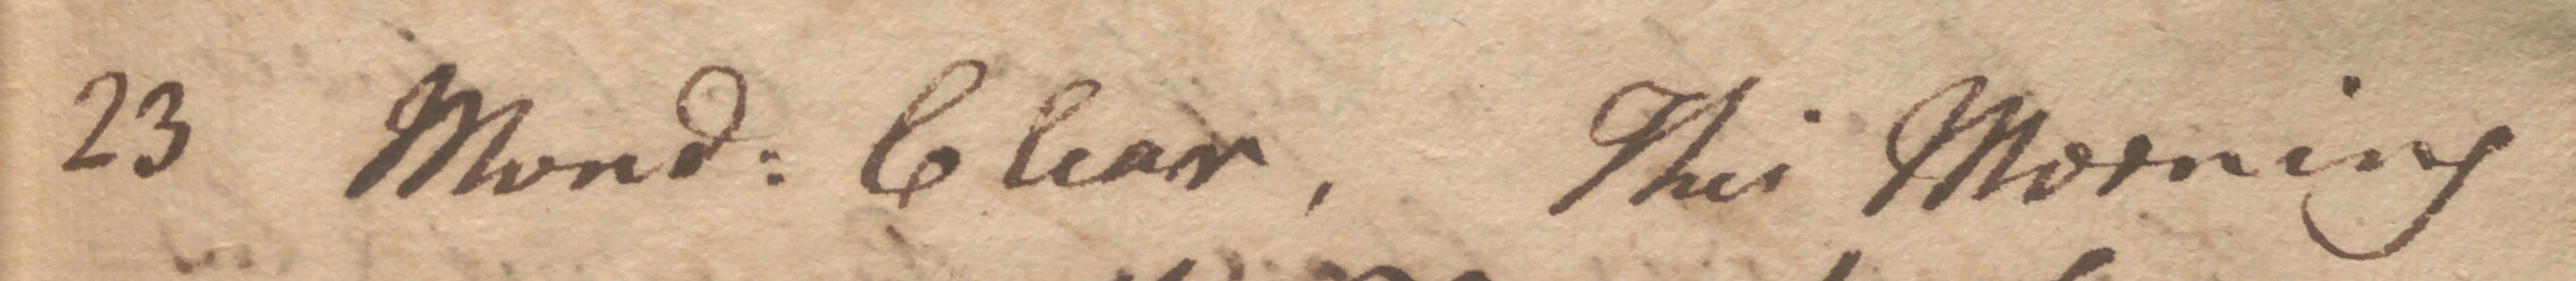23 Mond. Clear, This Morning
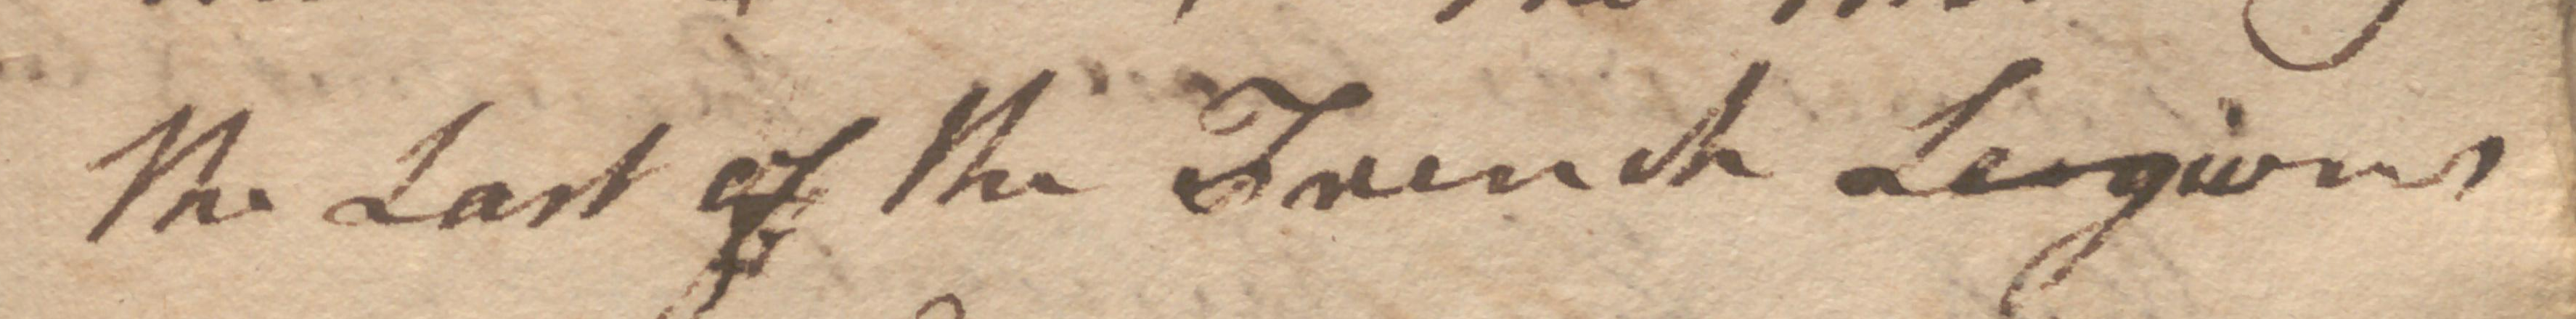the Last of the French Legions
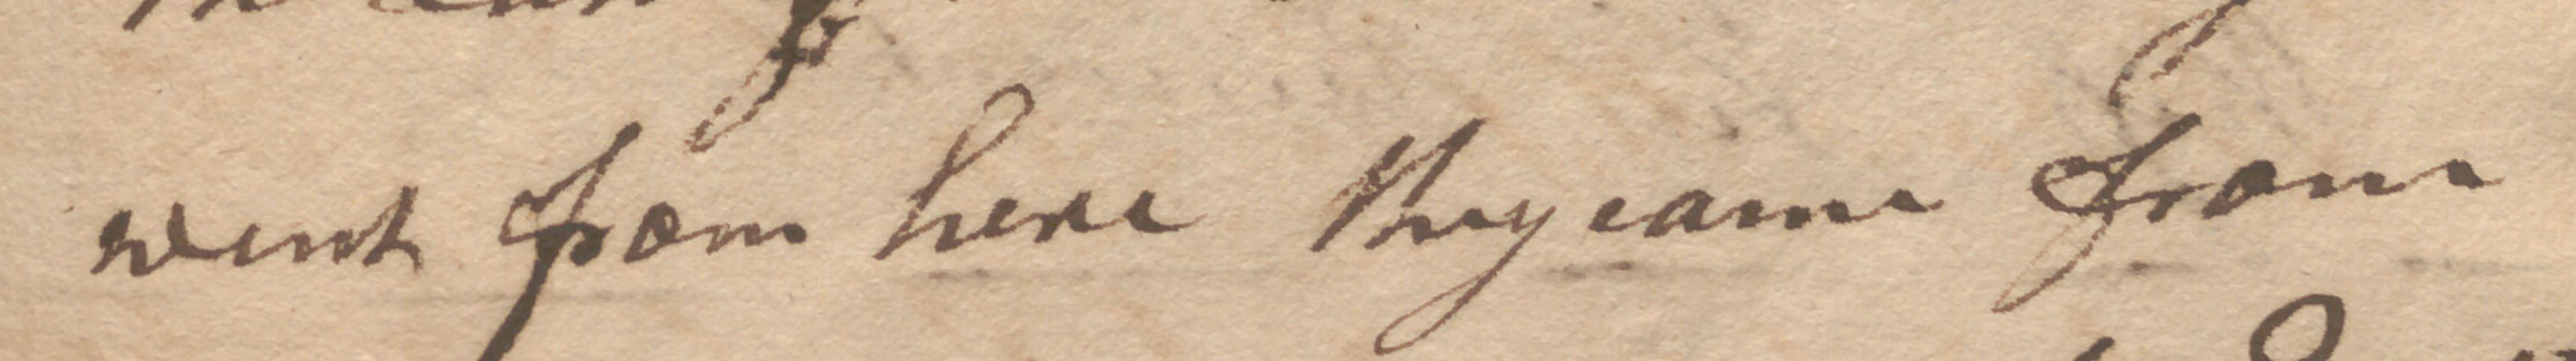went from here they came from
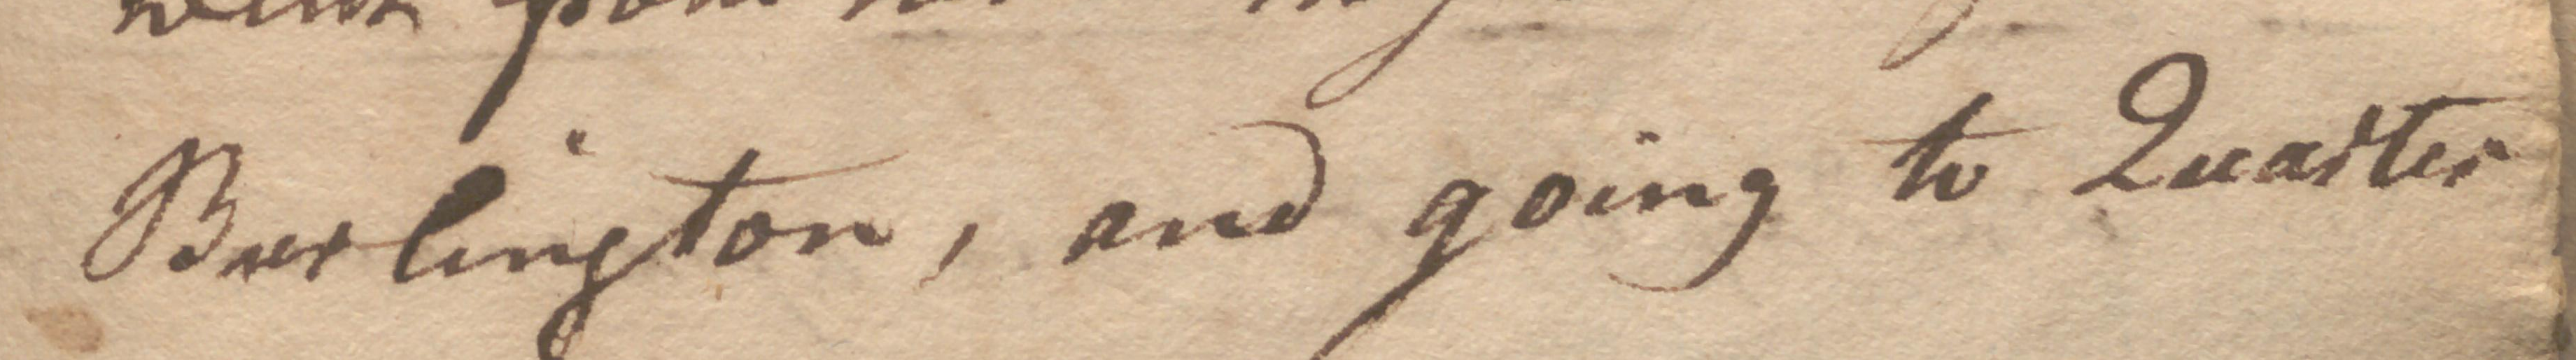Burlington, and going to Quarter
